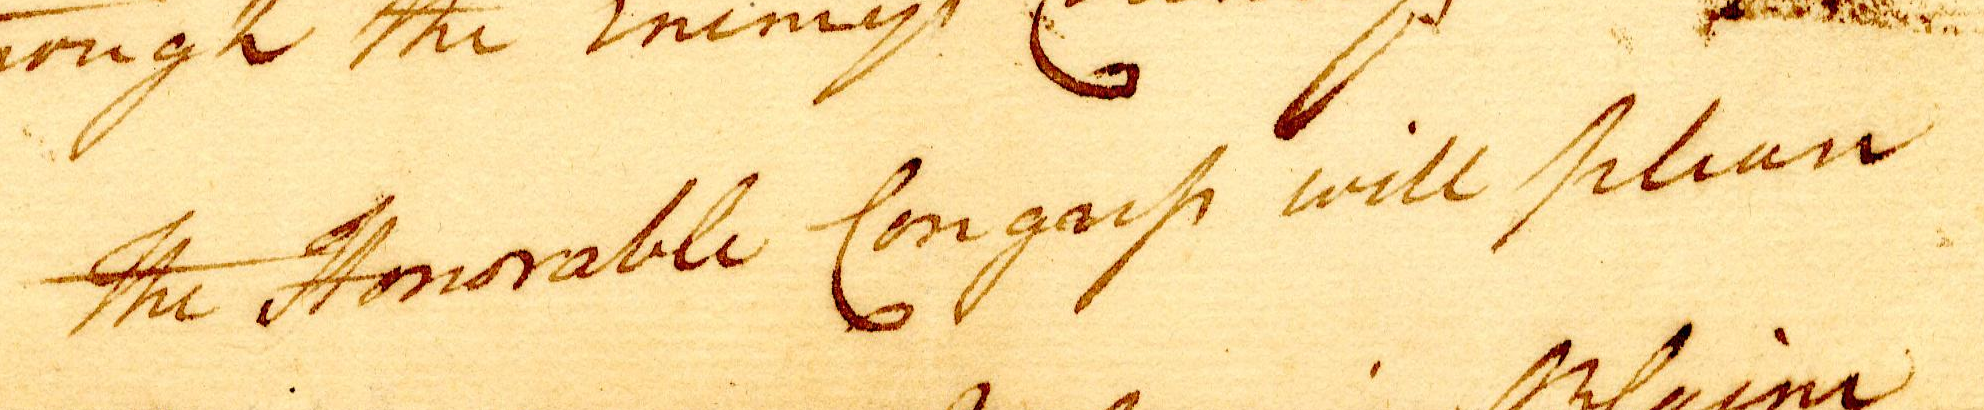The Honorable Congress will please
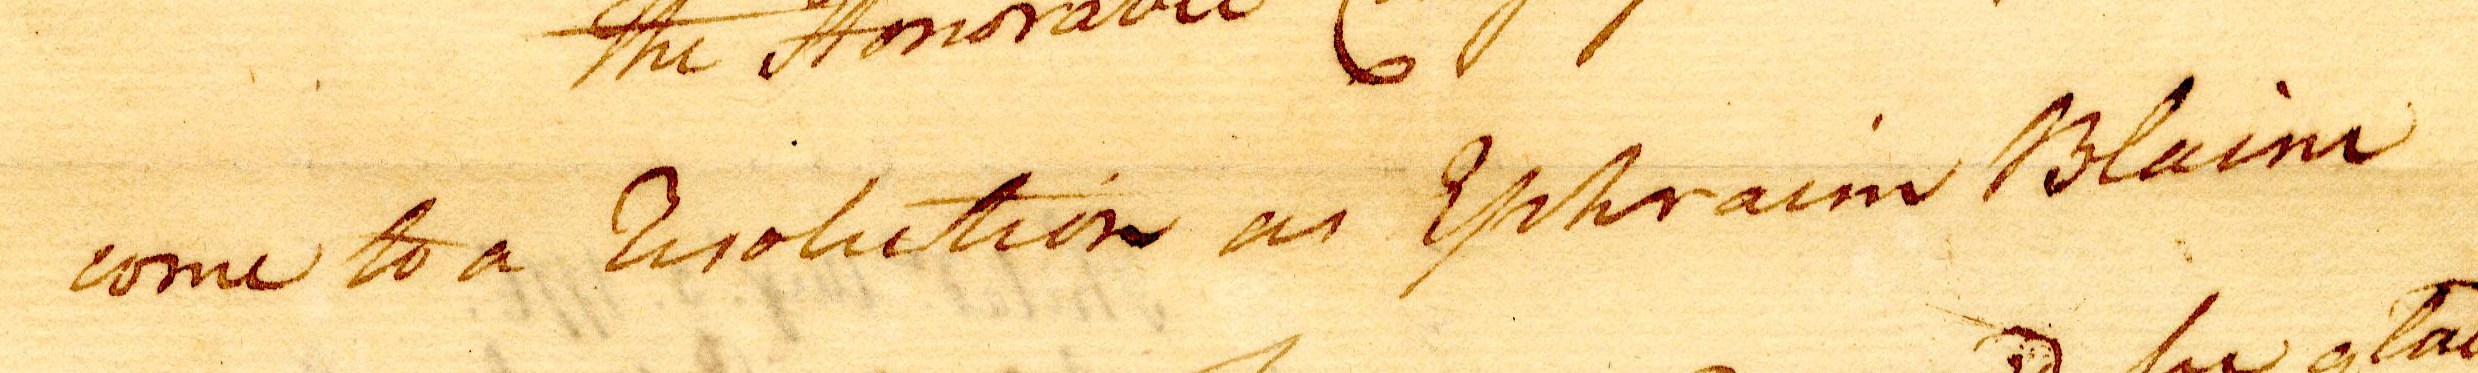come to a Resolution as Ephraim Blaine
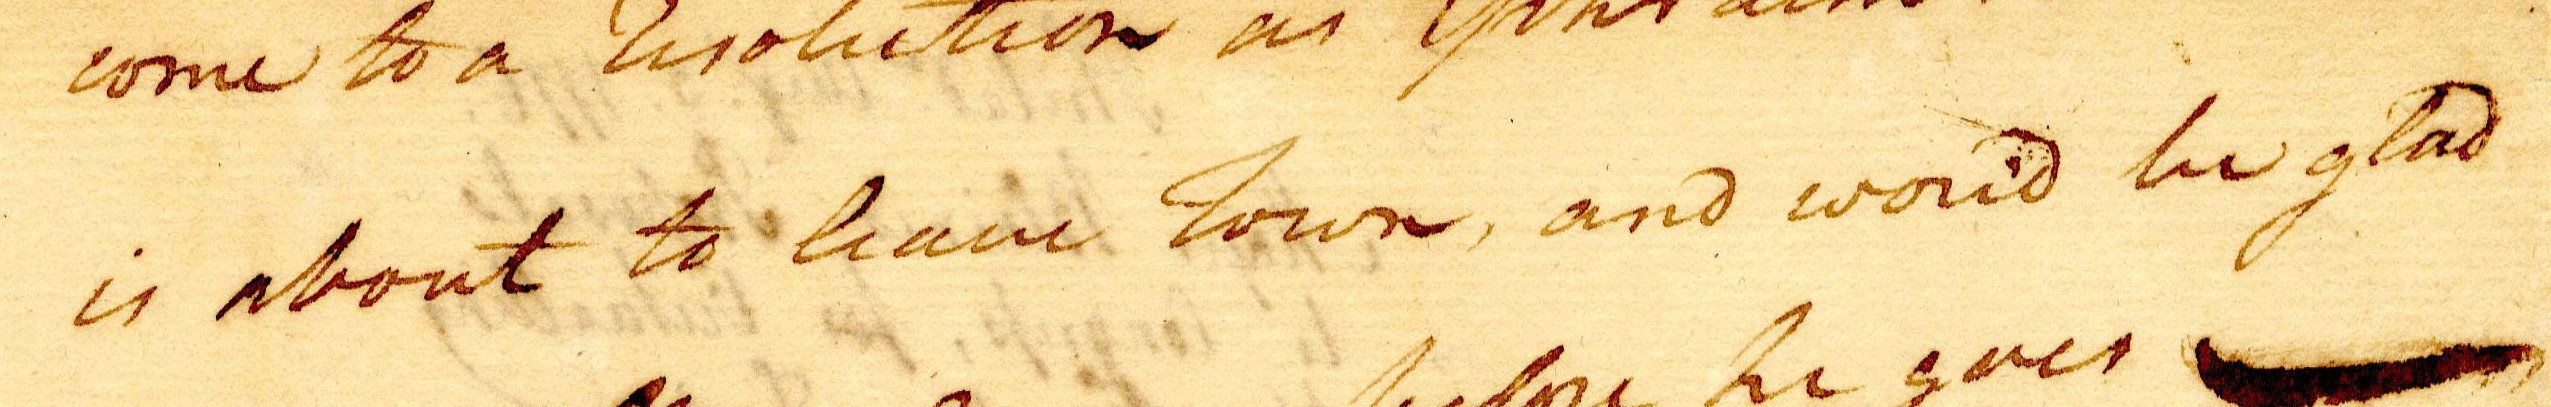is about to leave Town, and wou'd be glad
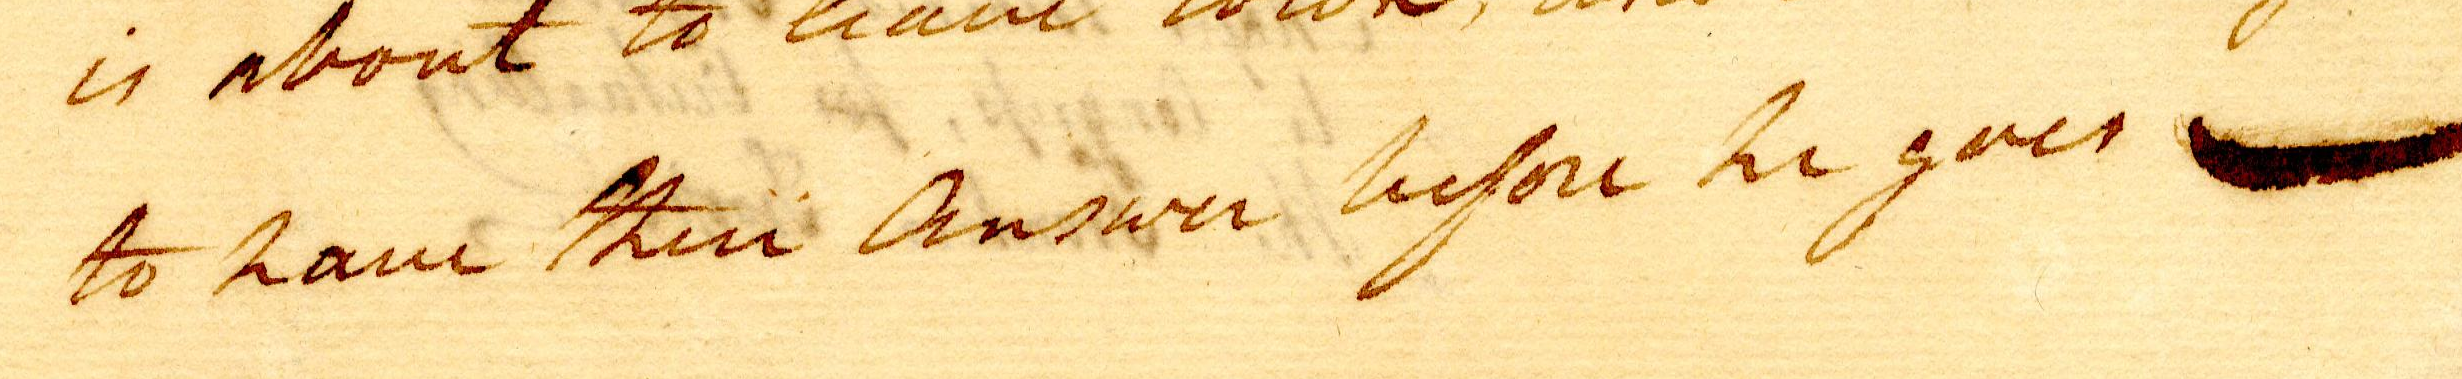to have their Answer before he goes-
